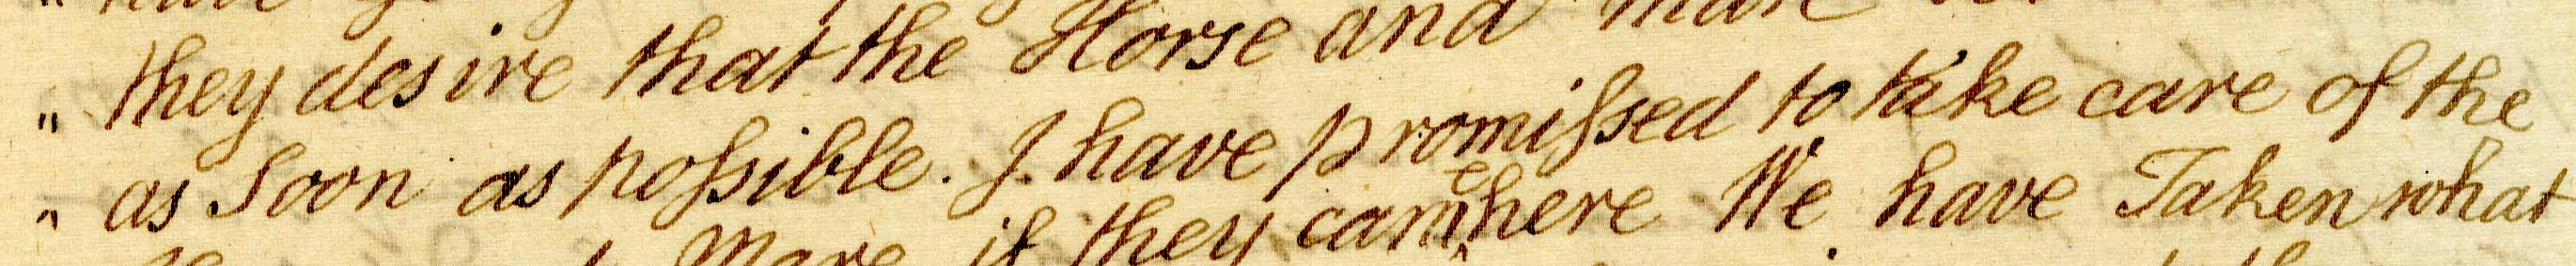"as Soon as possible. I have promissed to take care of the
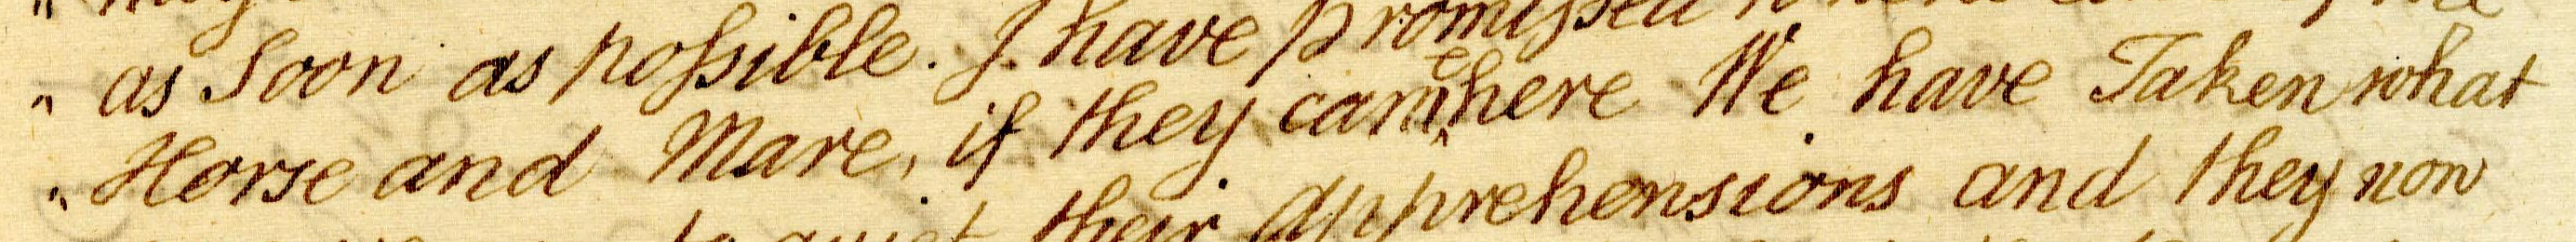"Horse and Mare, if they cam^e here We have Taken what
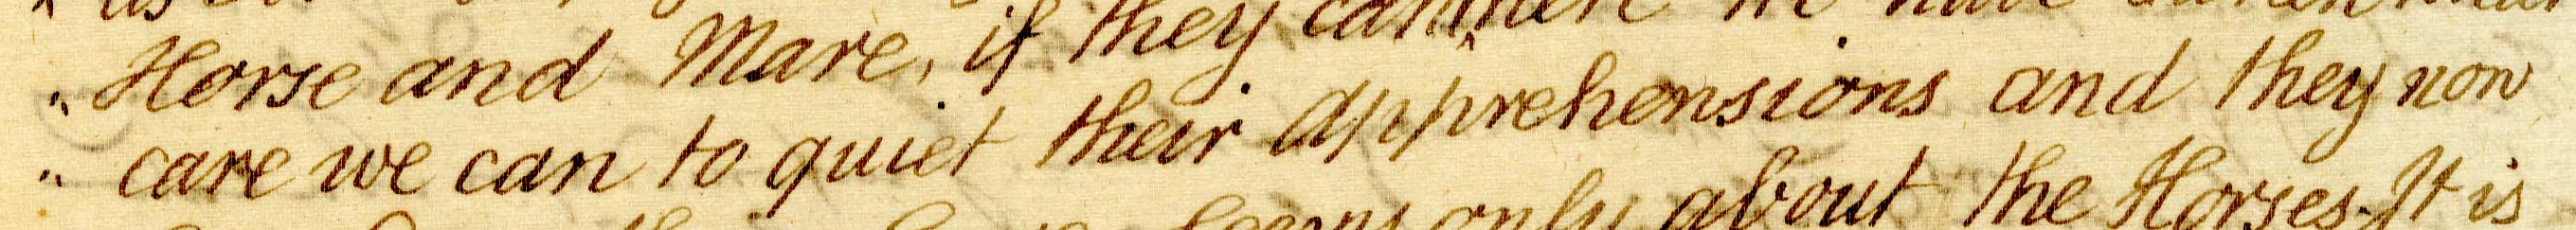"care we can to quiet their Apprehonsions and they now
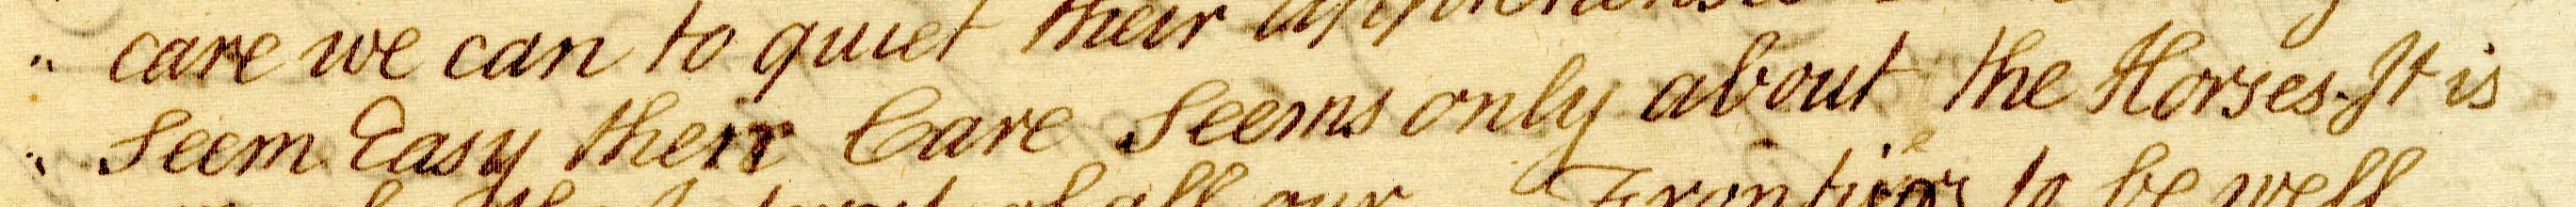"seem Easy their Care Seems only about the Horses. It is
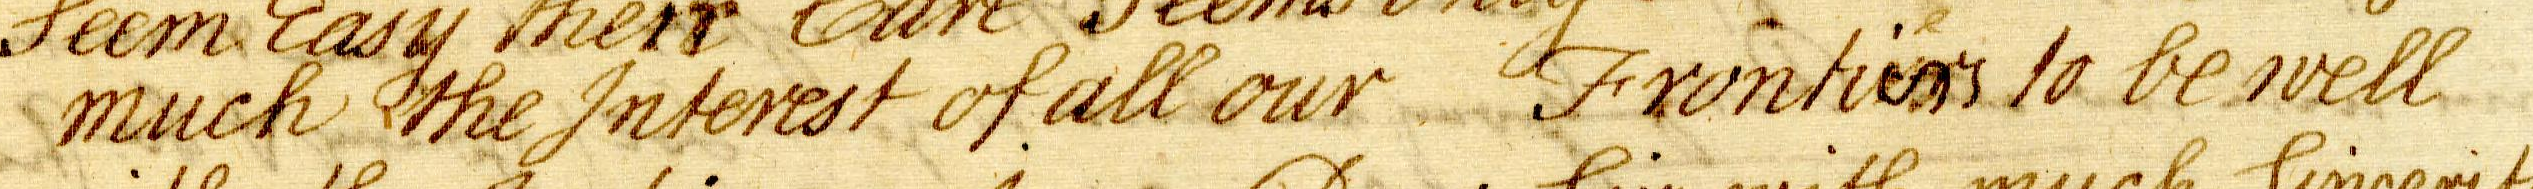much the Interest of all our Frontiers to be well
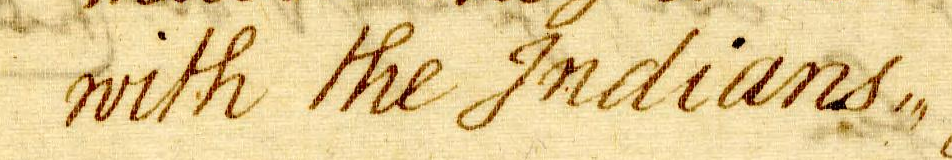with the Indians."
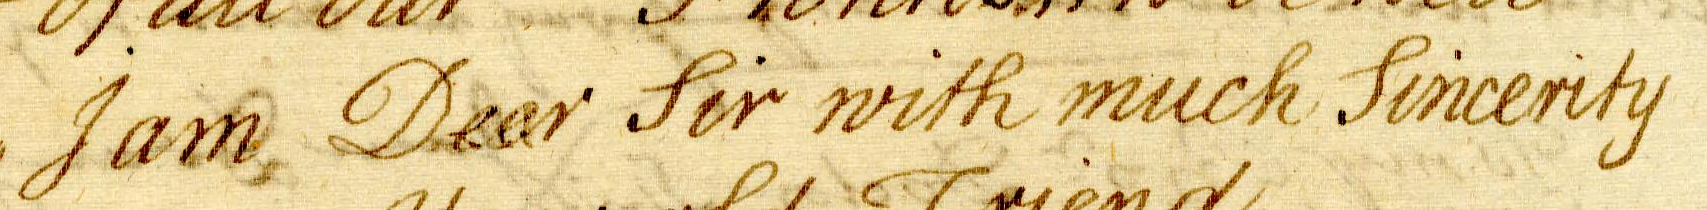I am Dear Sir with much Sincerity
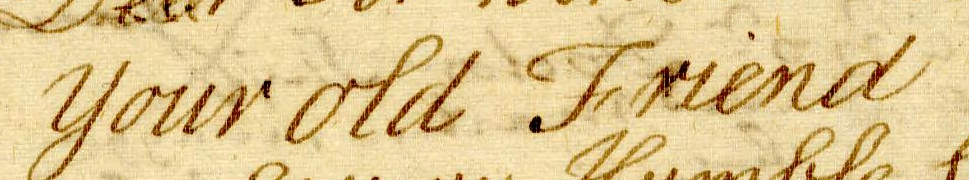Your old Friend
